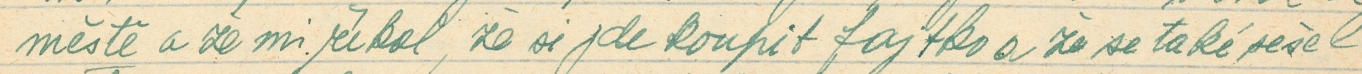městě a že mi říkal, že si jde koupit fajfku a že se také sešel
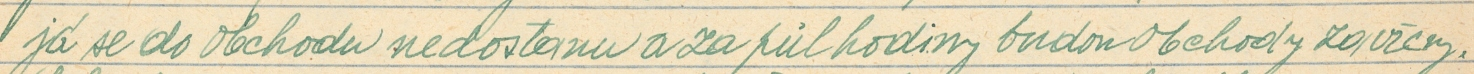já se do obchodu nedostanu a za půl hodiny budou obchody zavřeny.
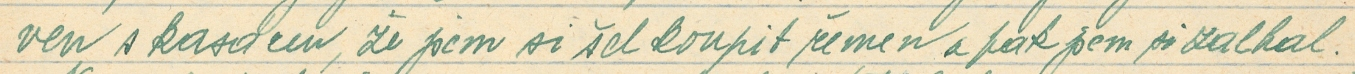ven s kasáren, že jsem si šel koupit řemen a pak jsem si zalhal.
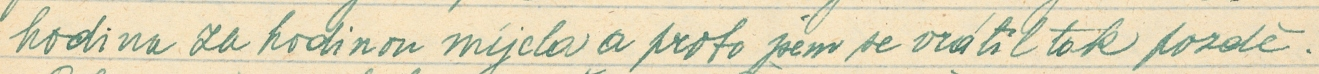hodina za hodinou míjela a proto jsem se vrátil tak pozdě.
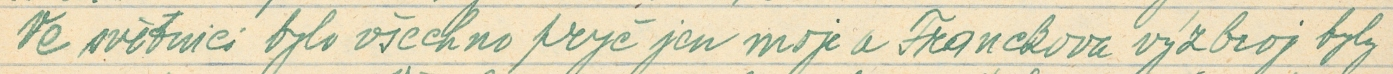Ve světnici bylo všechno pryč jen moje a Franckova výzbroj byly
